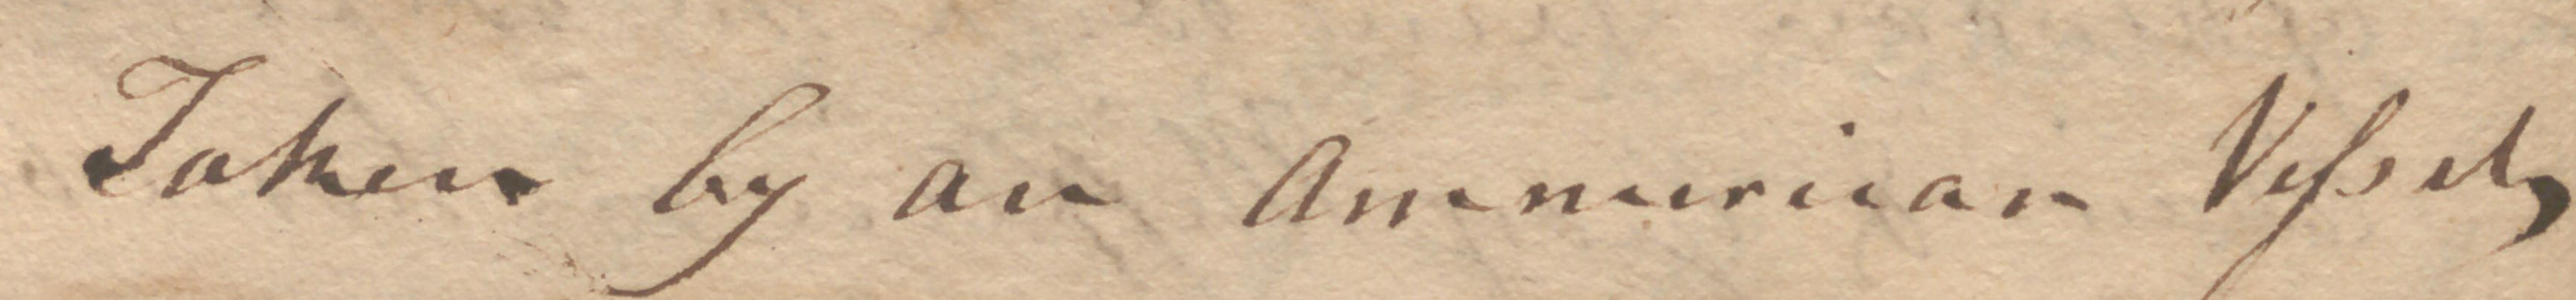Taken by an American Vessel
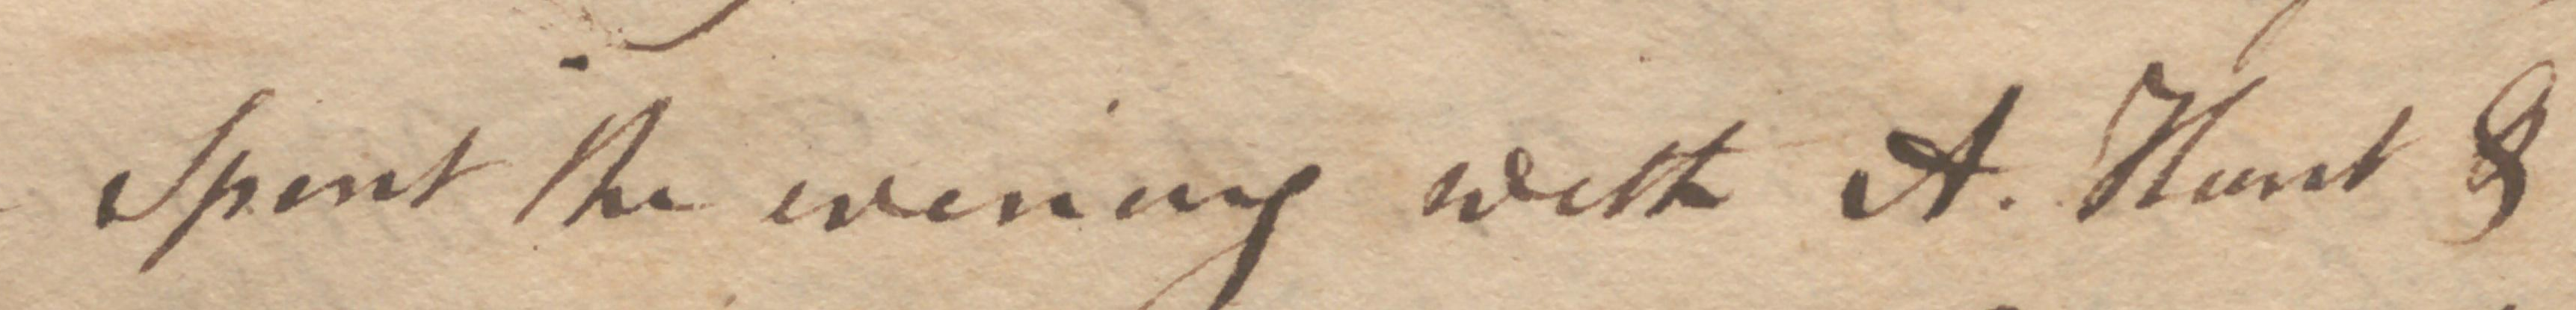spent the evening with A. Hunt &
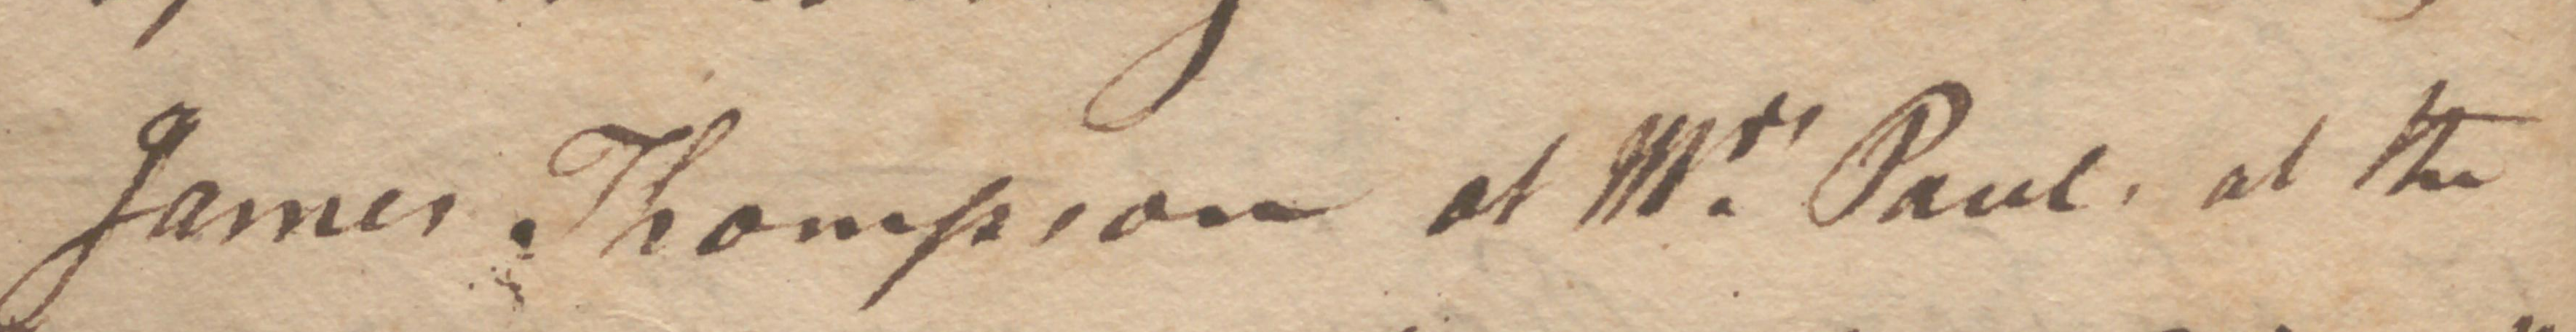James Thompson at M^rs. Paul. at the
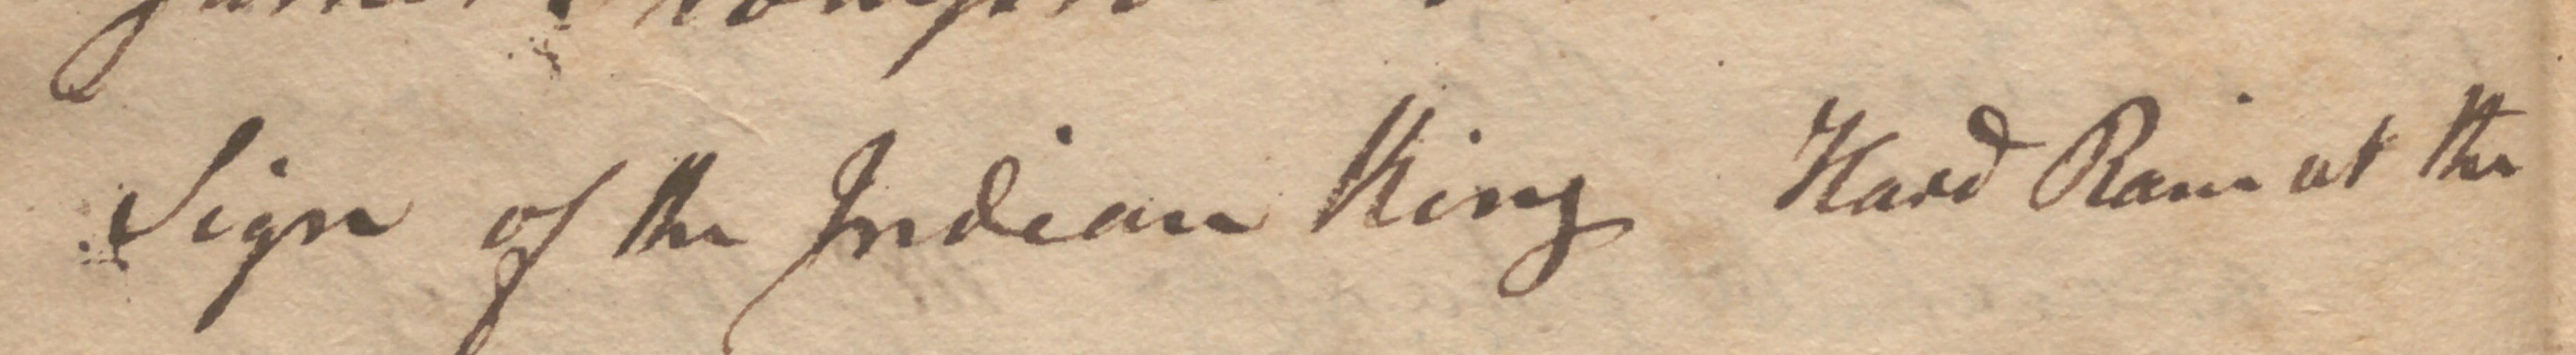Sign of the Indian King Hard Rain at the
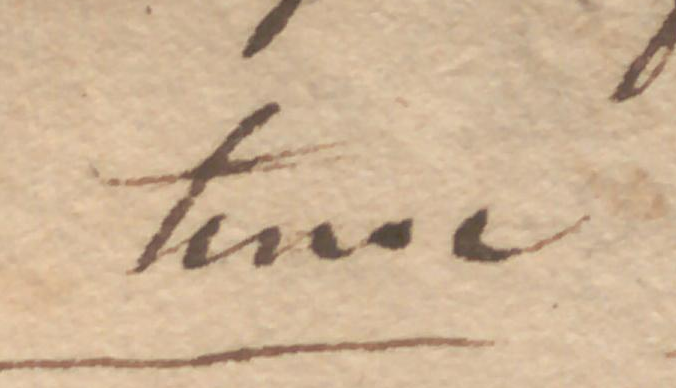time
